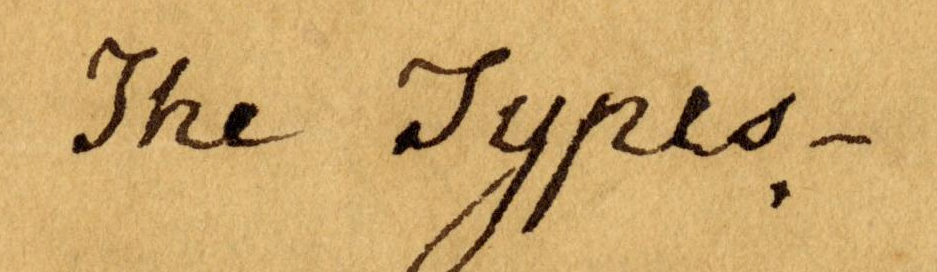The Types,-
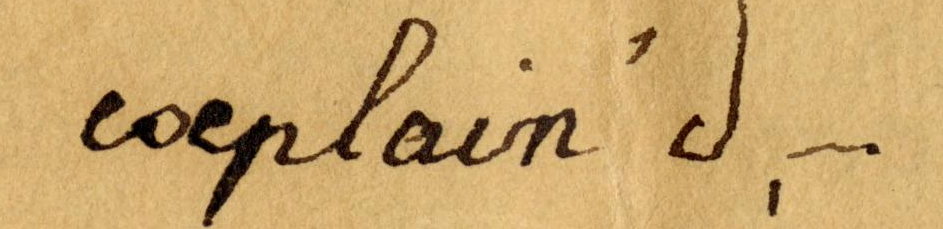exlpain'd,-
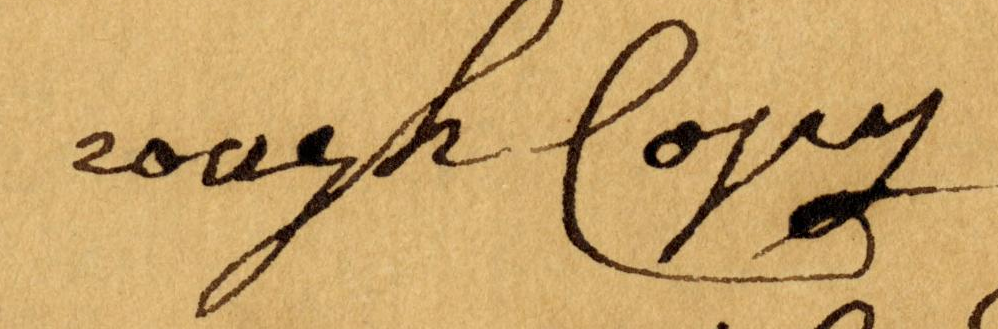rough Copy
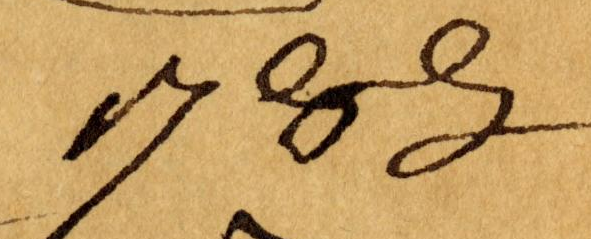1783
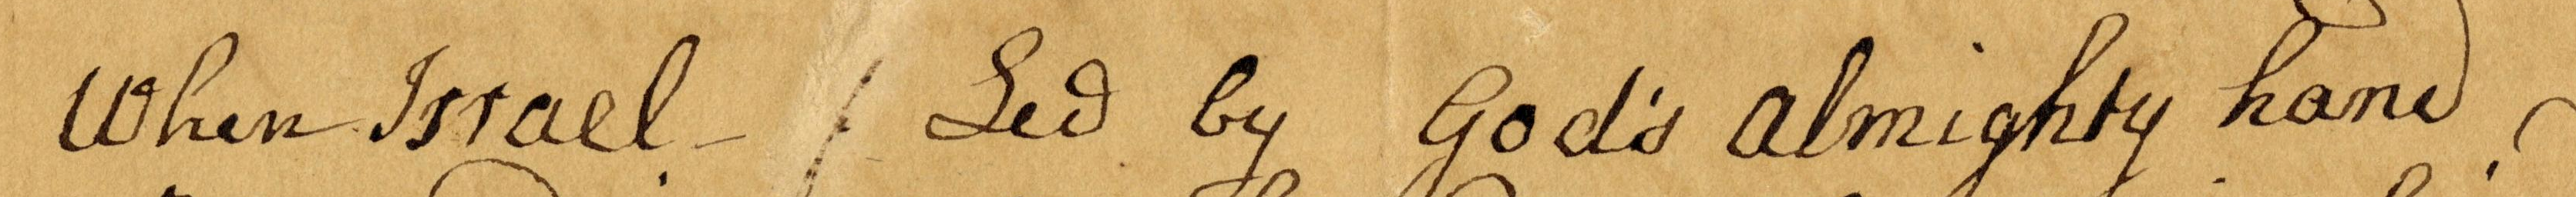When Israel Led by God's almighty hand
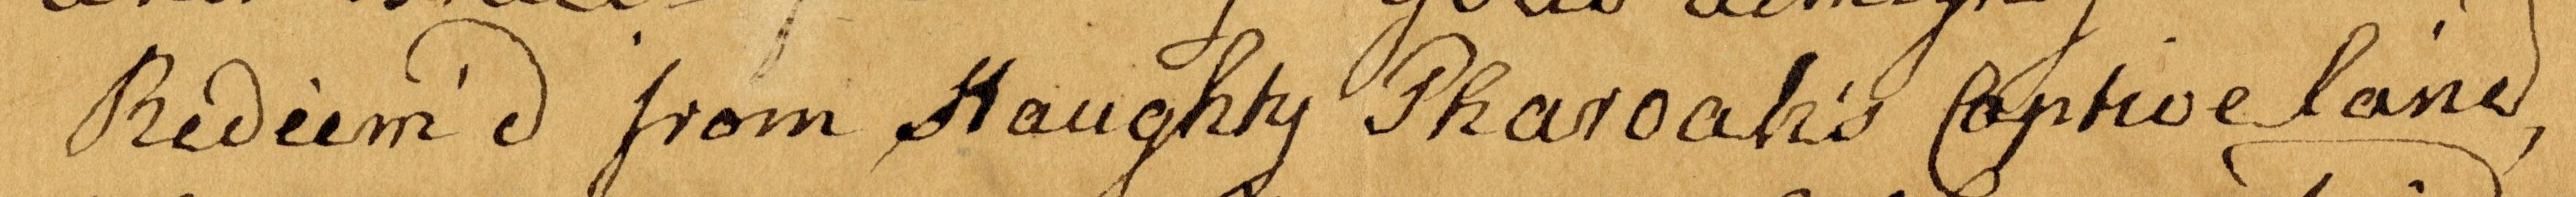Redeem'd from Haughty Pharoah's Captive land,
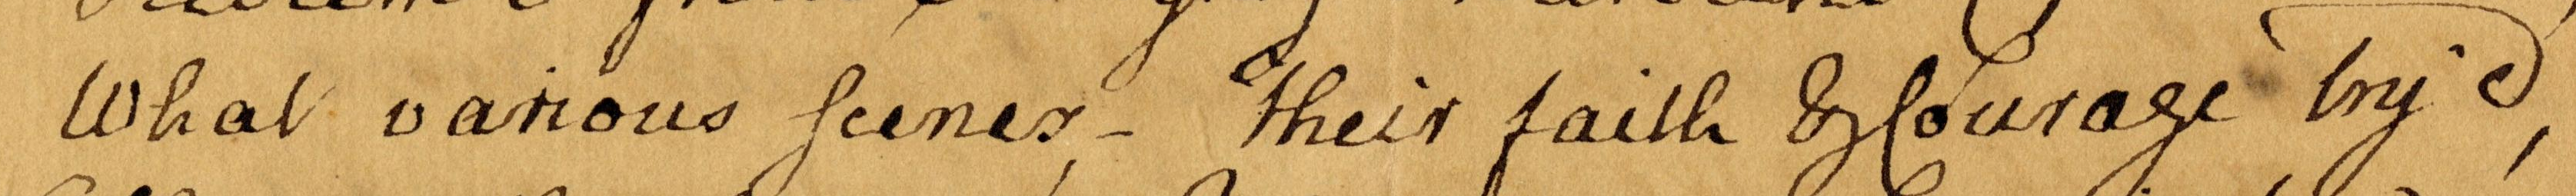What various scenes- their faith & Courage try'd,
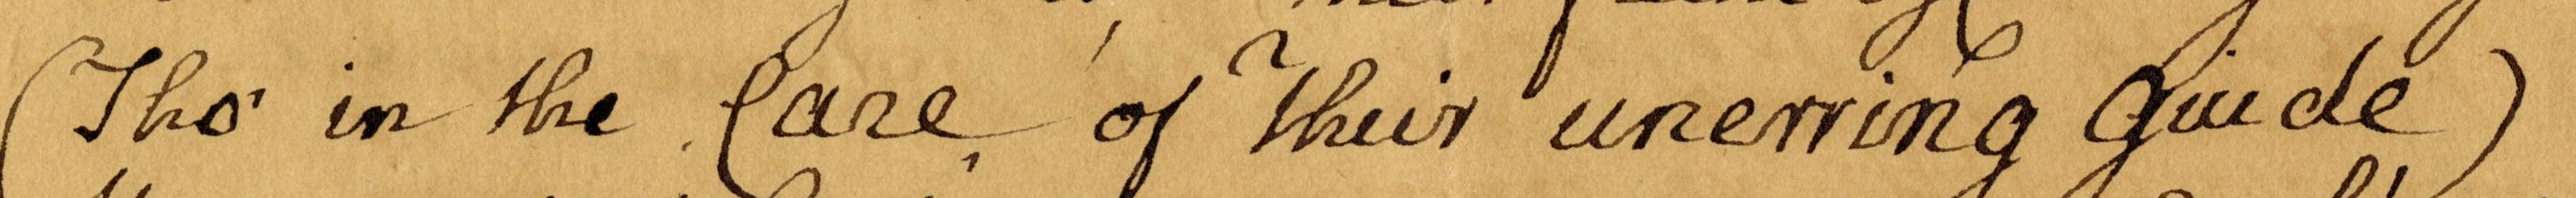(Tho' in the Care of their unerring Guide)
